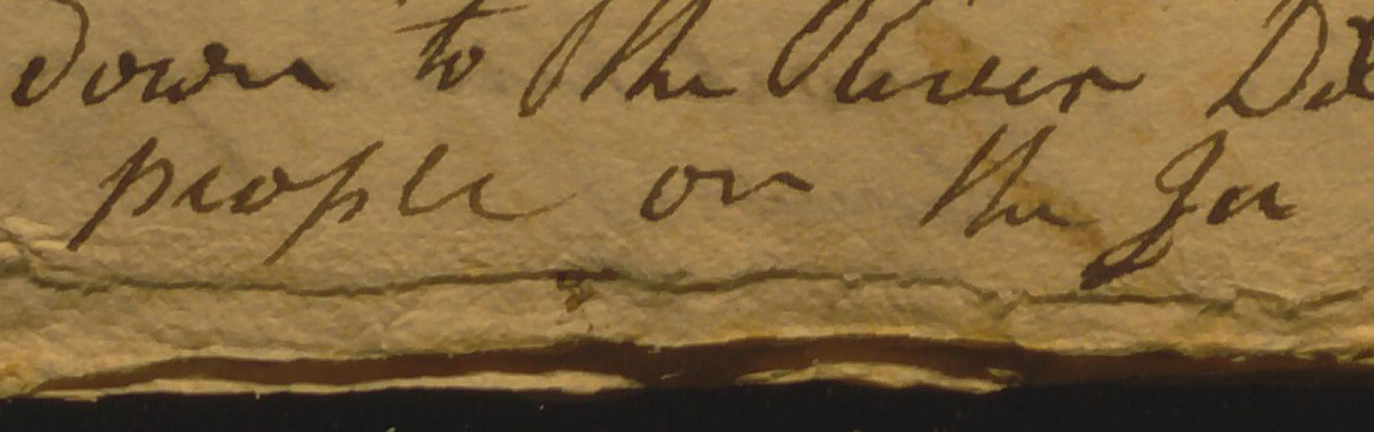people on the Ice
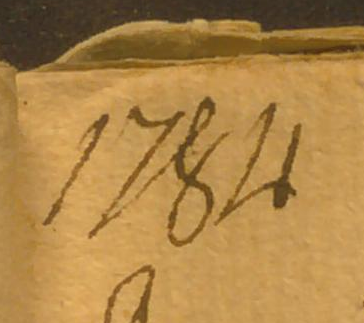1784
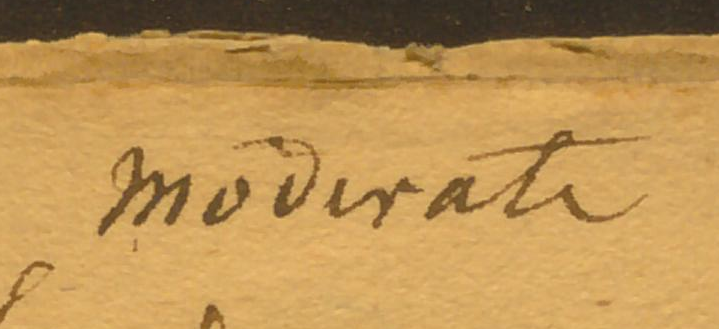Moderate
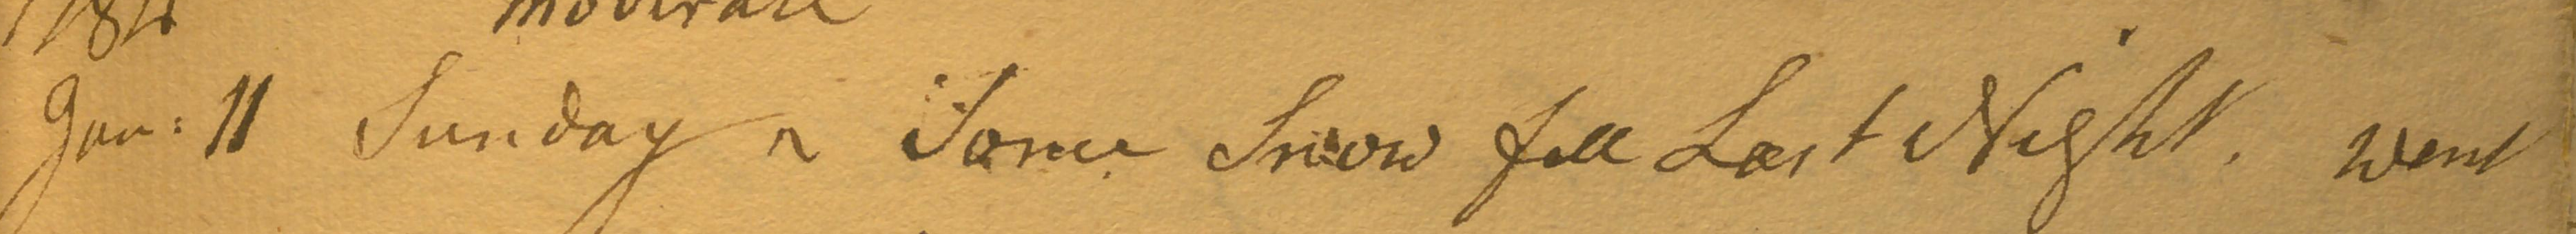Jan: 11 Sunday Some snow fell Last Night. went
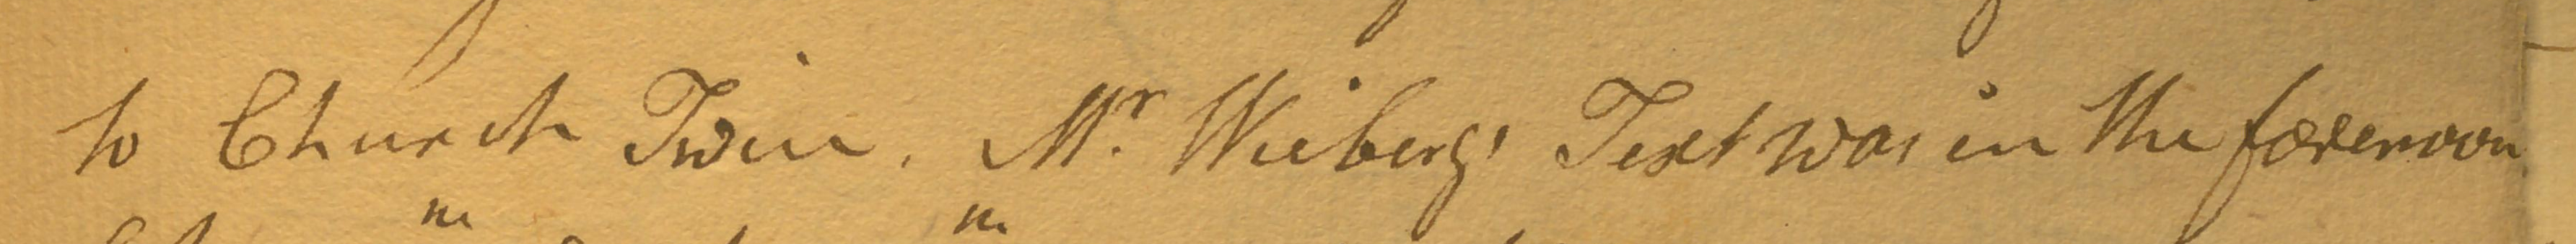to Church Twice, M^r. Weibergs Text was in the forenoon
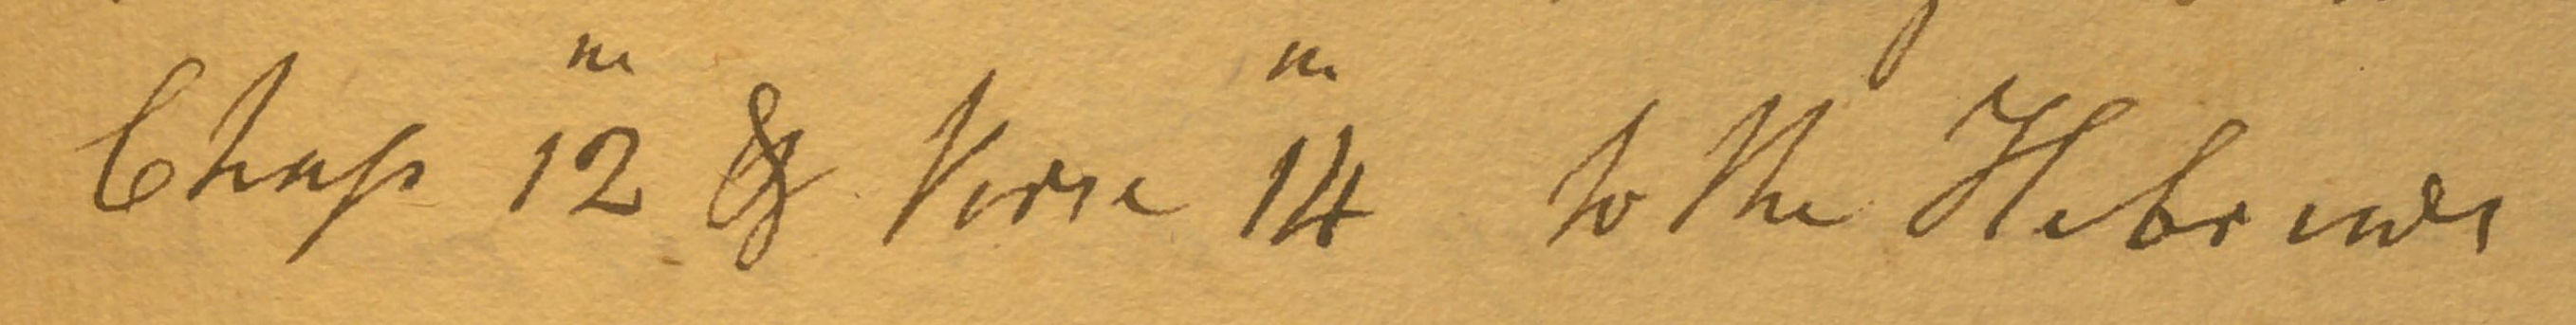Chap 12^th & Verse 14^th to the Hebrews
